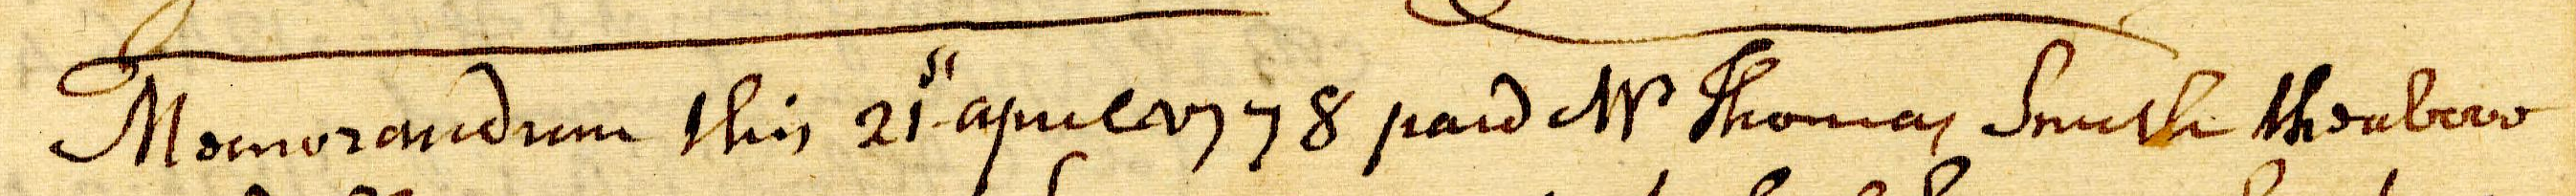Memorandum this 21^st. April 1778 paid M^r Thomas Smith the above
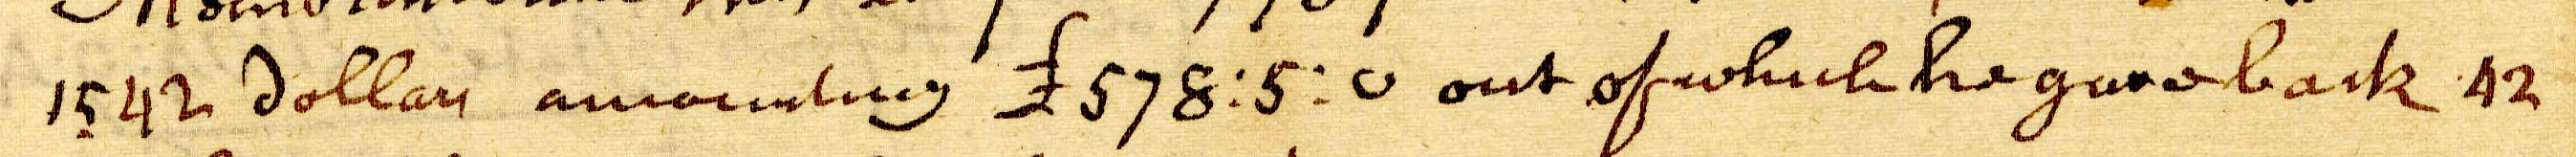1542 dollars amounting £578..5..0 out of which he gave back 42
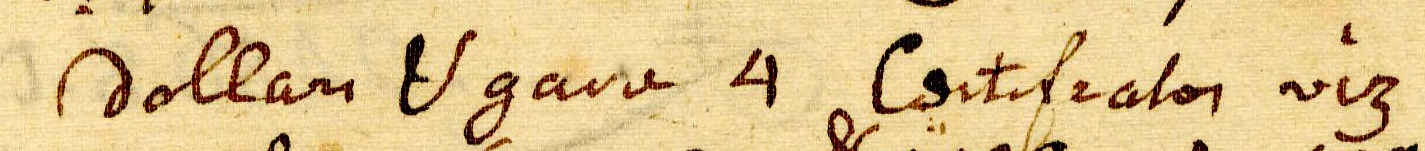dollars I gave 4 Certificates viz
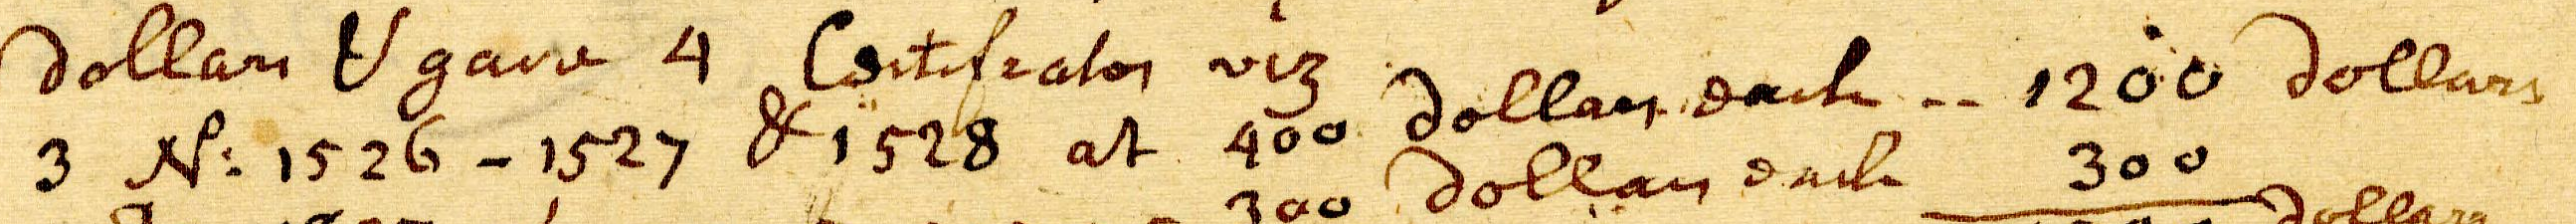3 N: 1526-1527 & 1528 at 400 dollars each-- 1200 dollars
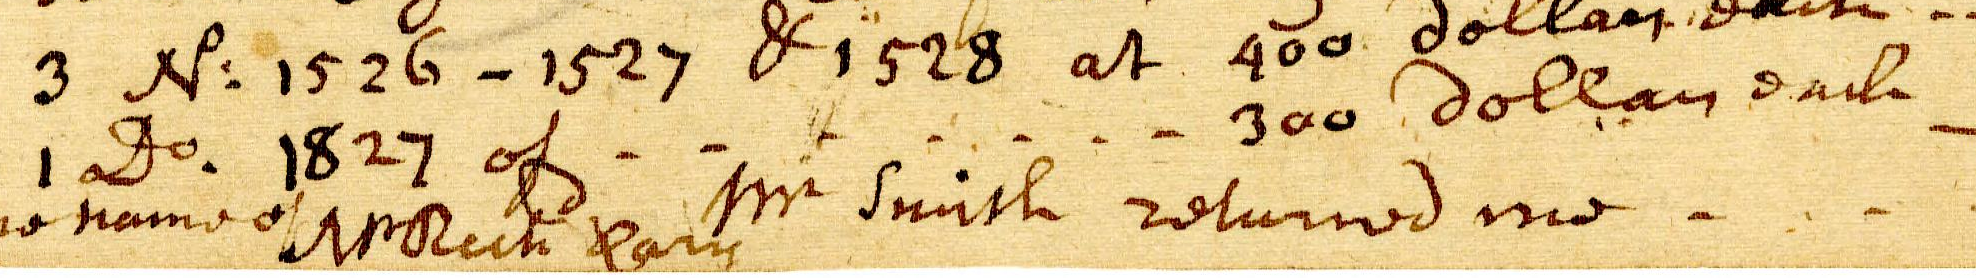1 D^o. 1827 of -------300 dollars each
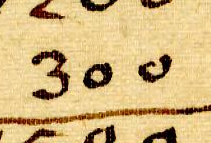300
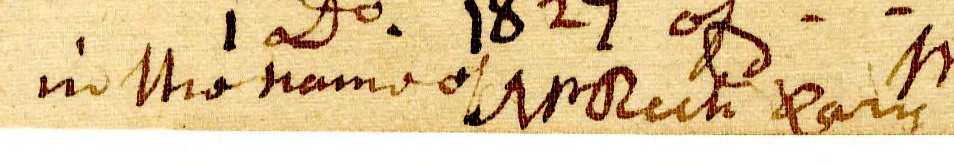in the name of M^r Rich^d Cary
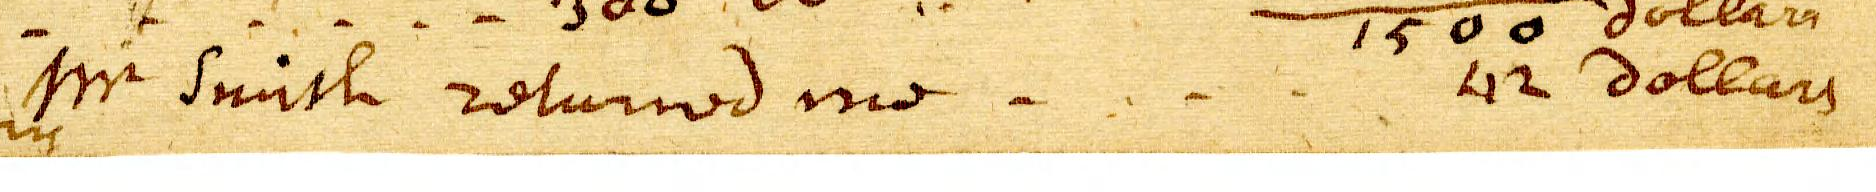M^r Smith returned me--- 42 dollars
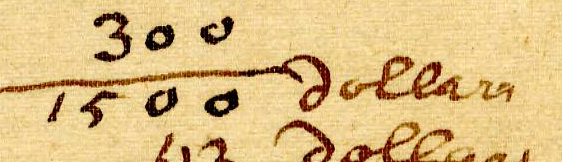1500 dollars
